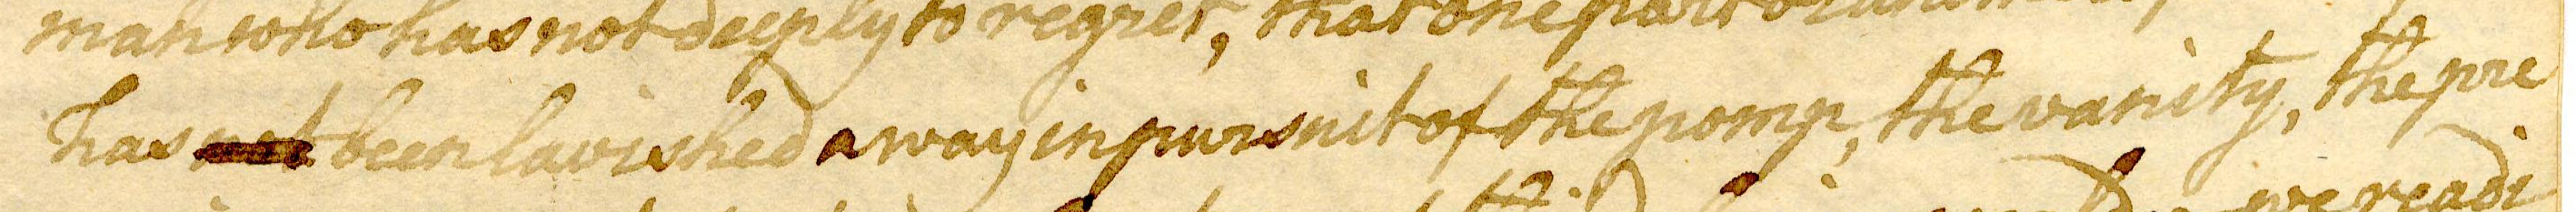has [not] been lavished away in pursuit of the pomp, the vanity, the pre
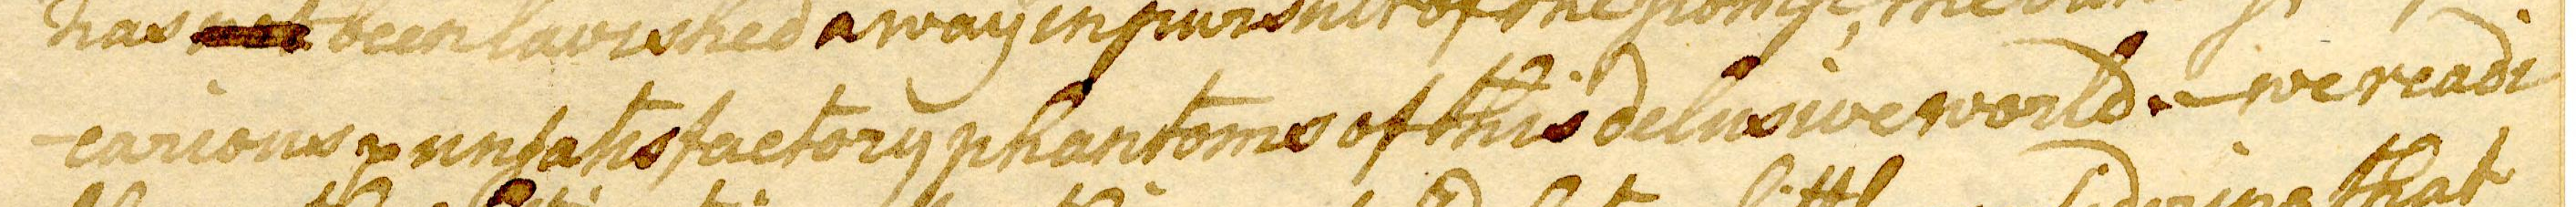-carious & unsatisfactory phantoms of this delusive world- we readi
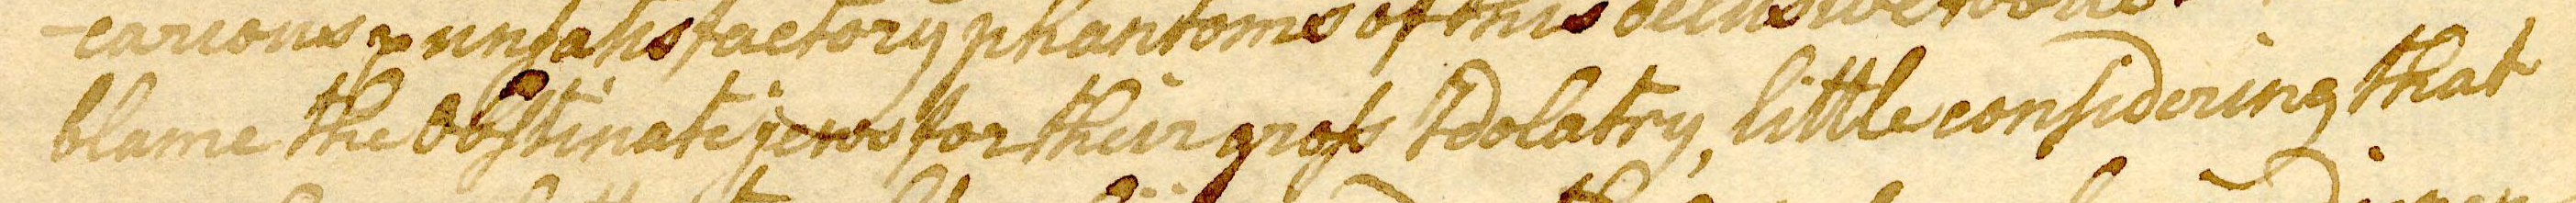blame the Obstinate jews for their gross Idolatry, little considering that
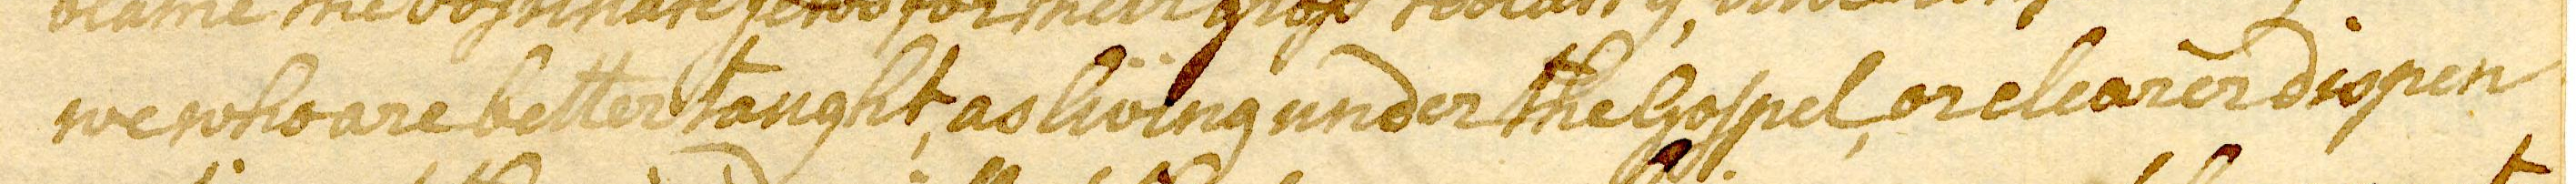we who are better taught, as living under the Gospel, or clearer dispen
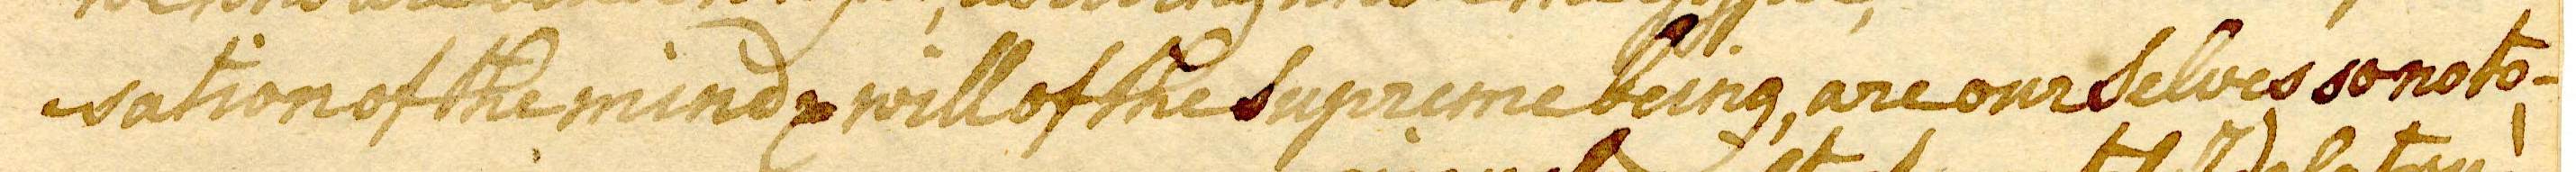-sation of the mind & will of the Supreme being, are our Selves so noto-
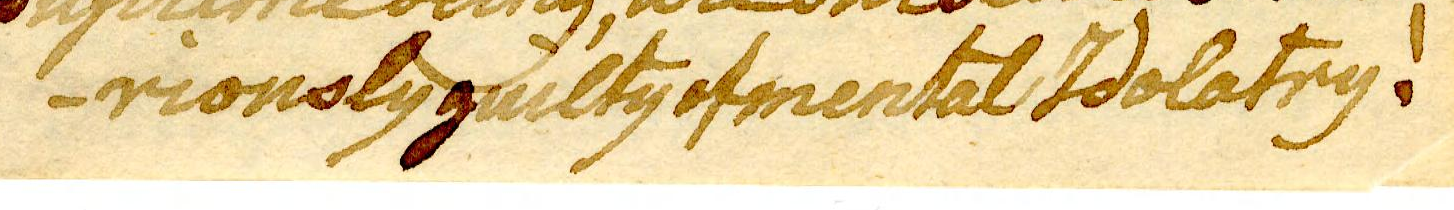-riously guilty of mental Idolatry!
